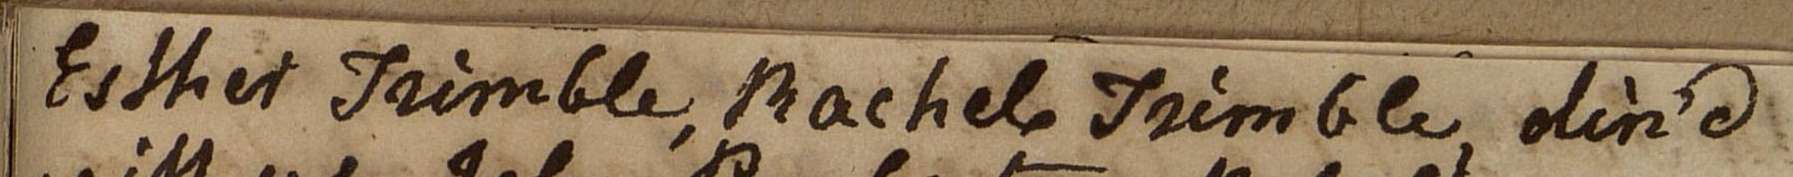Esther Trimble, Rachel Trimble, din'd
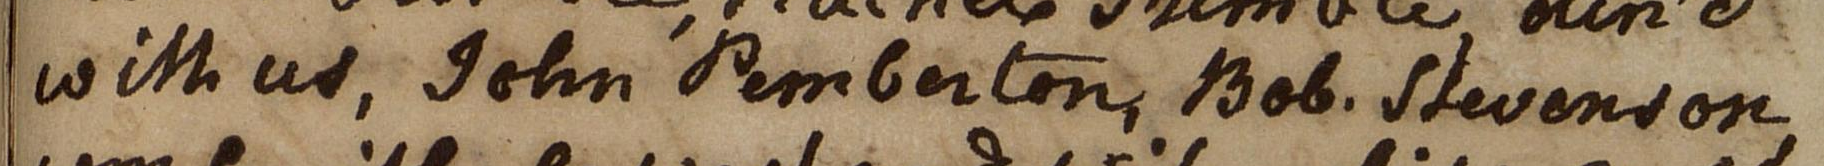with us, John Pemberton, Bob. Stevenson
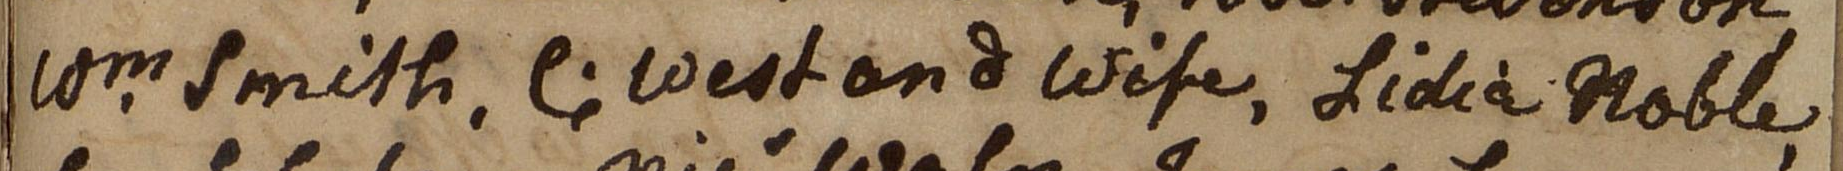W.^m Smith, C. West and wife, Lidia Noble,
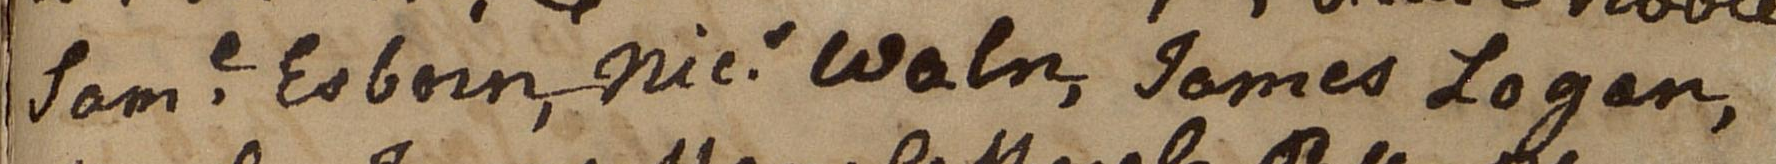Sam^l. Esborn, Nic.^s Waln, James Logan,
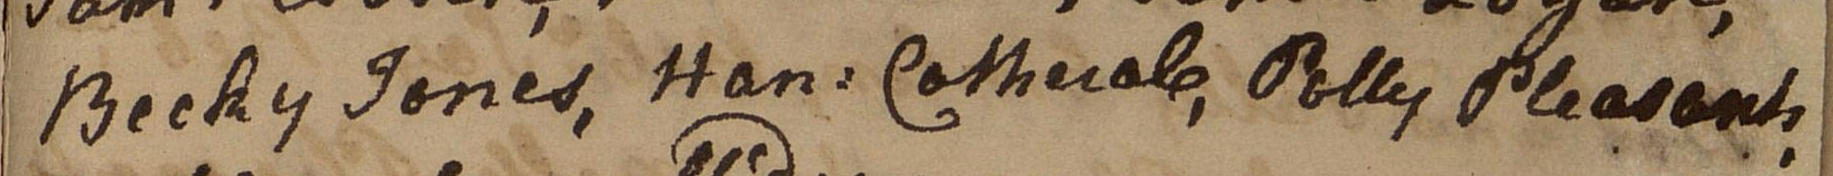Becky Jones, Han: Catheral, Polly Pleasant
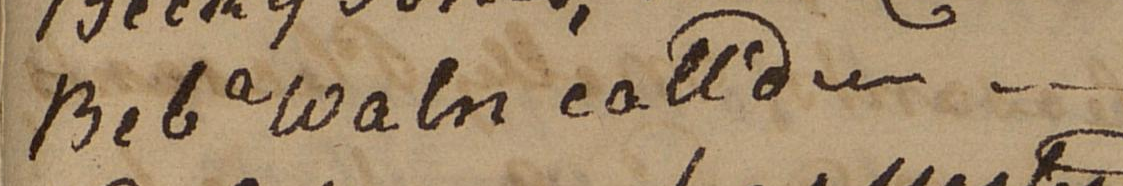Reb^a Waln call'd-
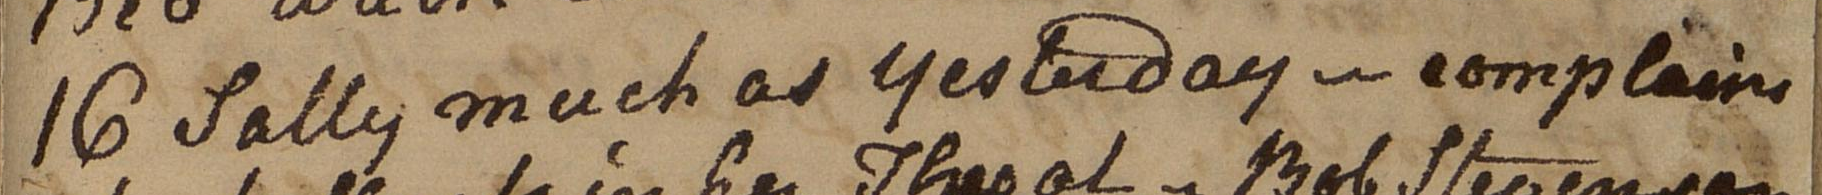16 Sally much as yesterday- complains
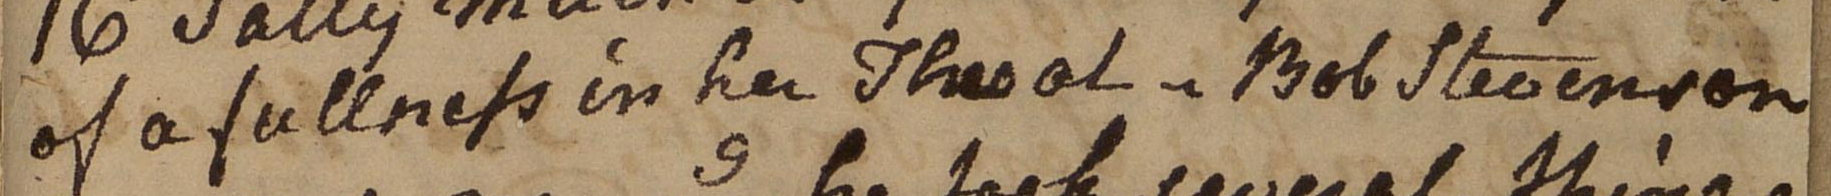of a fullness in her Throat- Bob Stevenson
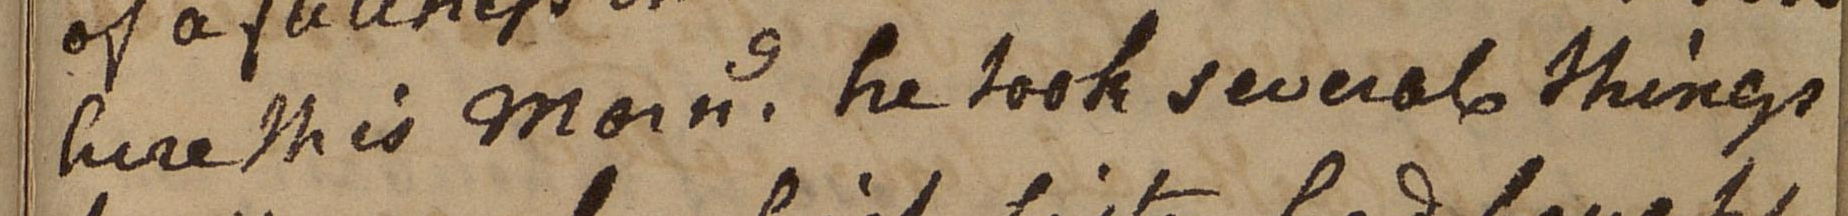here this Morn.^g, he took several things
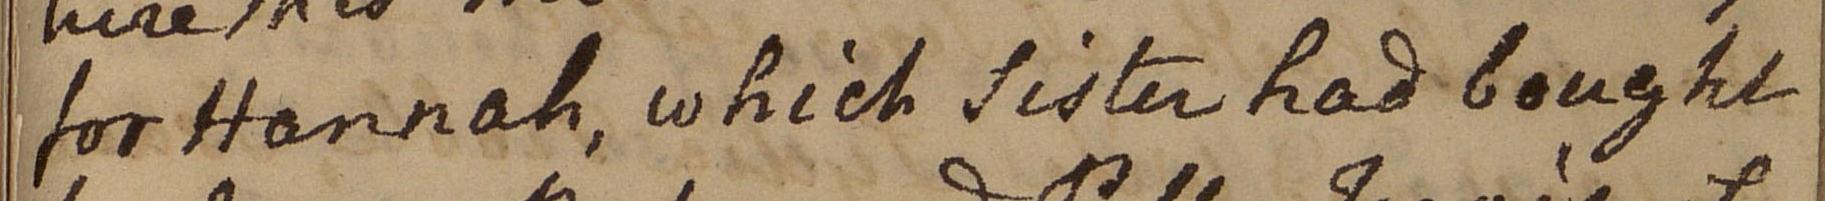for Hannah, which sister had bought
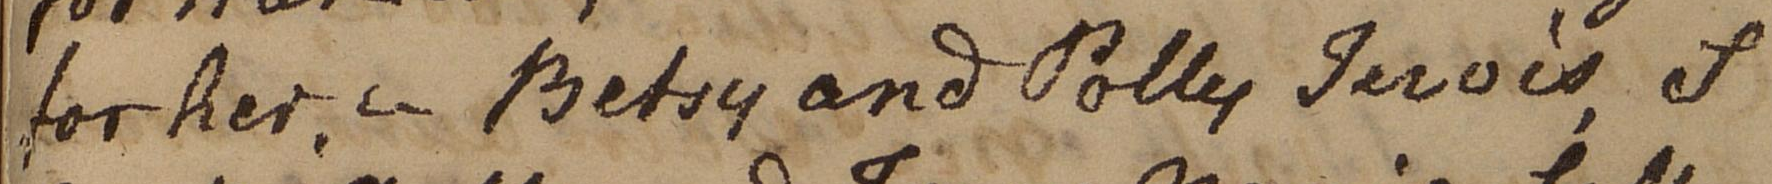for her- Betsy and Polly Jervis S
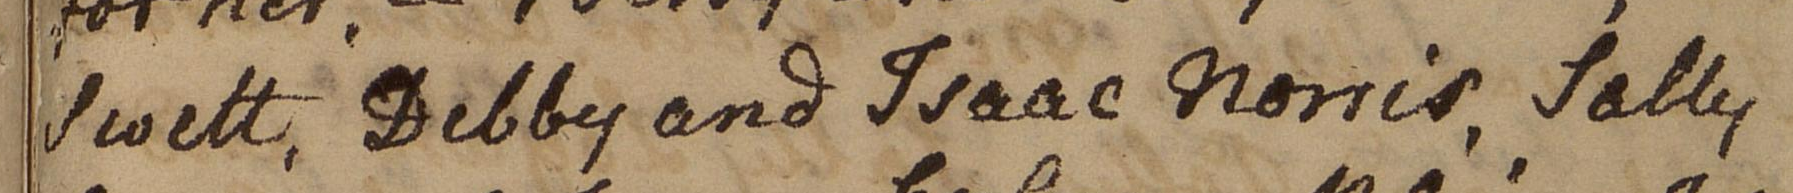Swett, Debby and Isaac Norris, Sally
